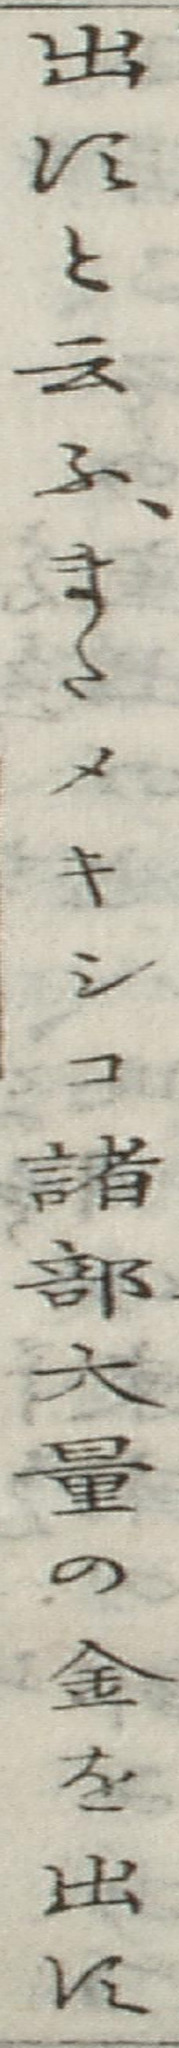出すと云ふ、またメキシコ諸部大量の金を出す、
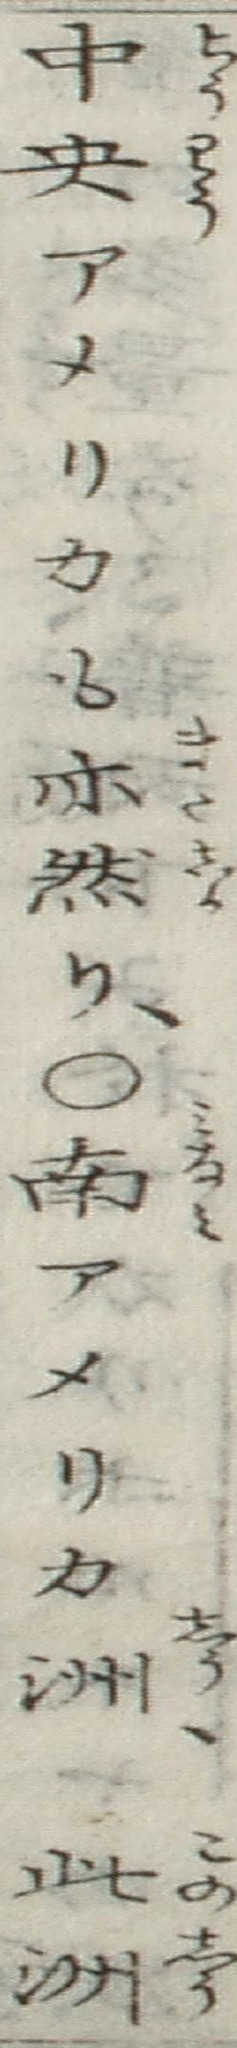中央アメリカも亦然り、〇南アメリカ洲、此洲
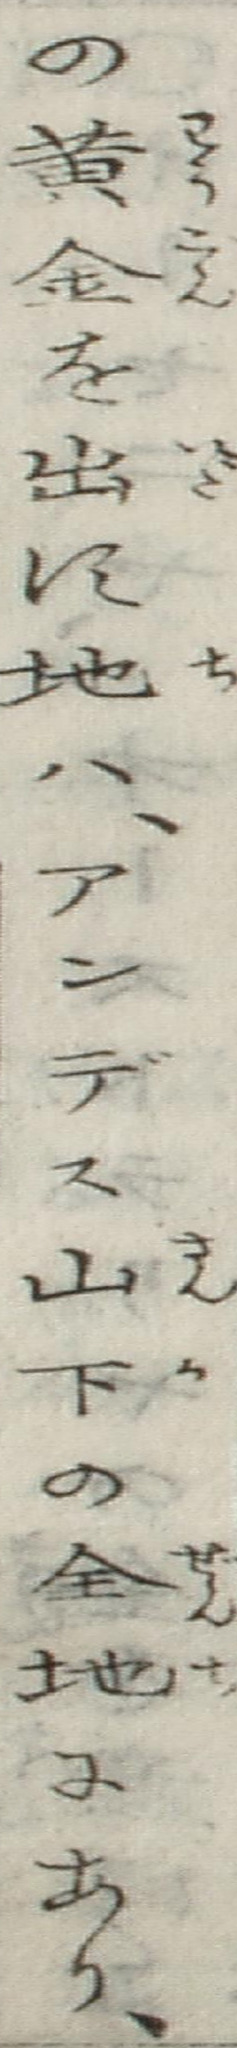の黄金を出す地は、アンデス山下の全地にあり、

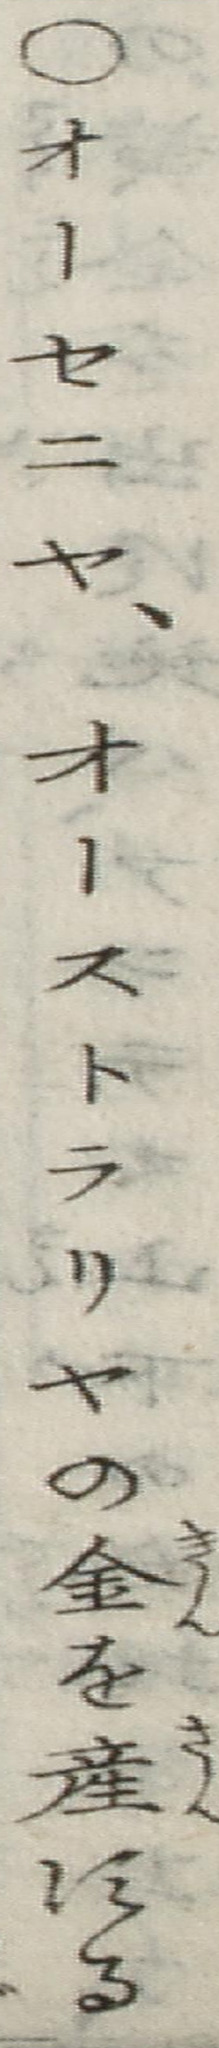○オーセニヤ、オーストラリヤの金を産する
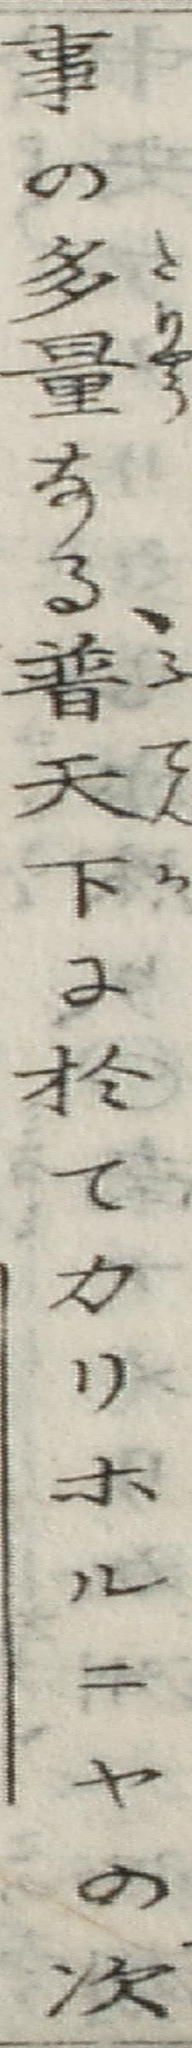事の多量なる、普天下に於てカリホルニヤの次
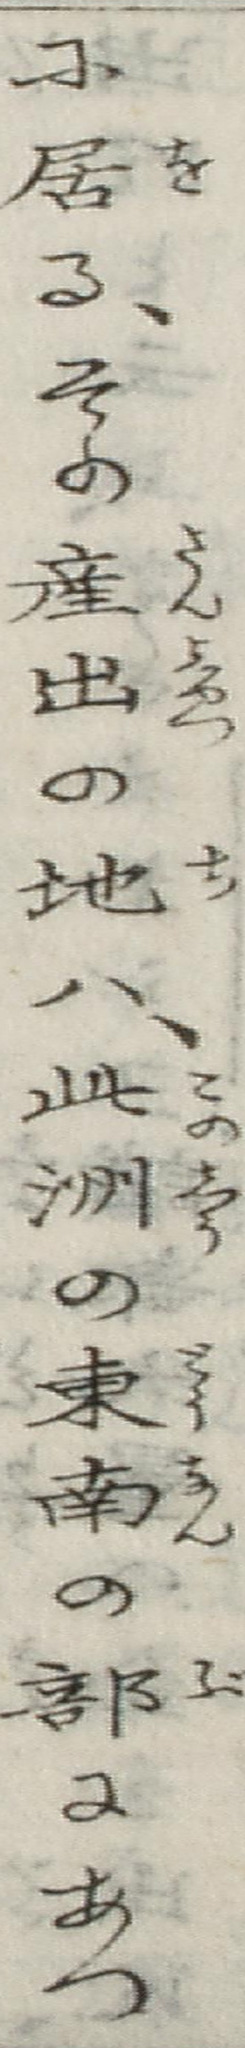に居る、その産出の地は、此洲の東南の部にあつ
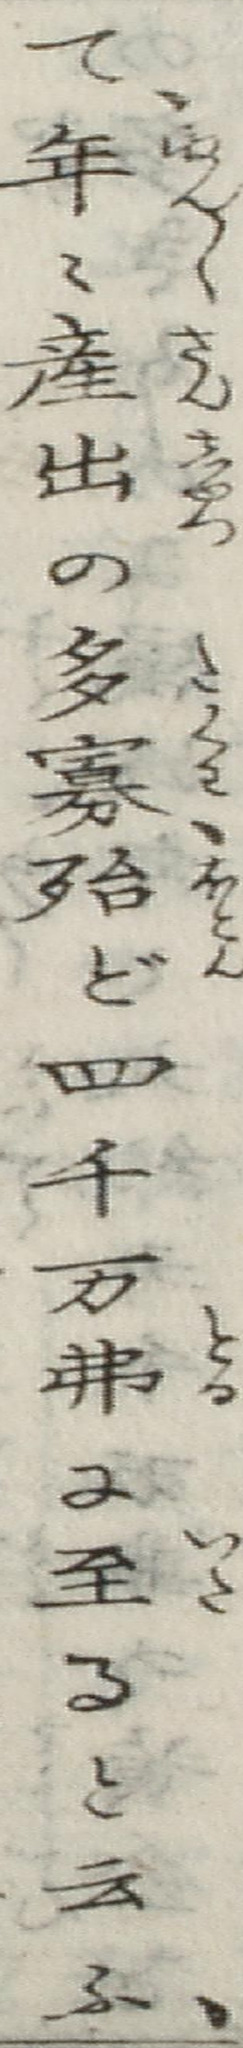て、年〻産出の多寡、殆ど四千万弗に至ると云ふ、
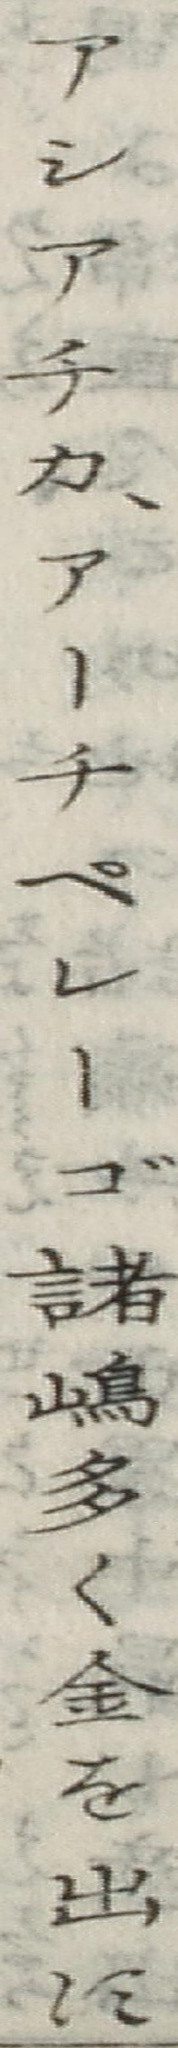アシアチカ、アーチペレーゴ諸嶋多く金を出す、
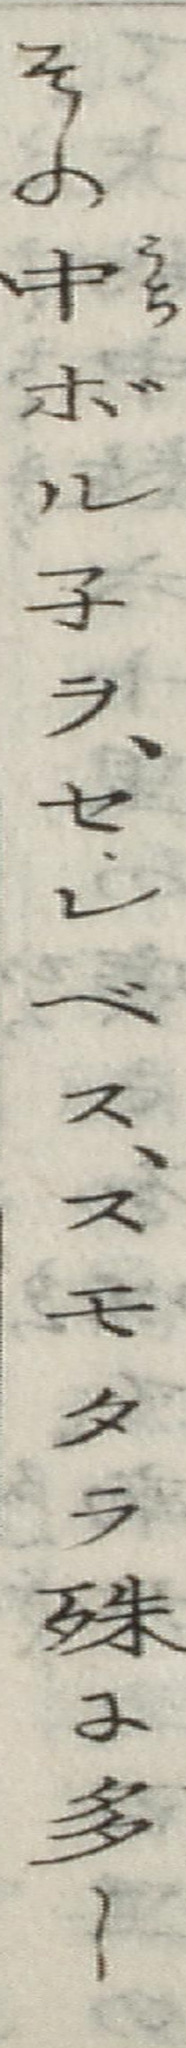その中ボル子ヲ、セレベス、スモタラ殊に多し
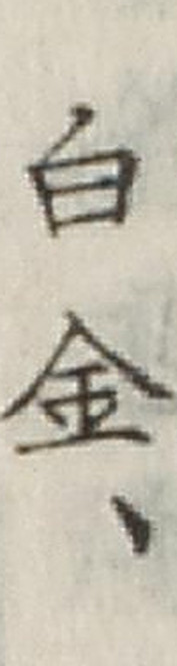白金、
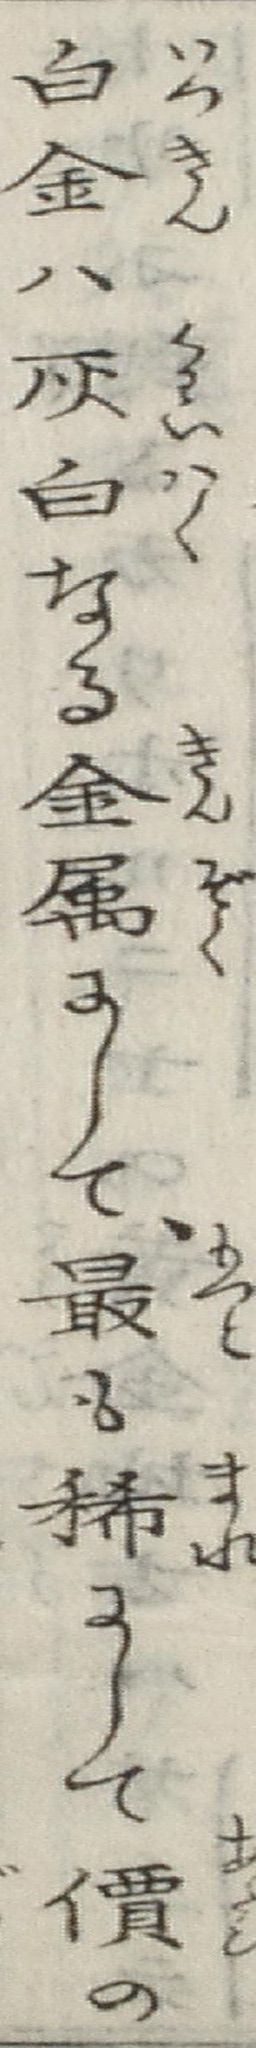白金は灰白なる金属にして、最も稀にして値の
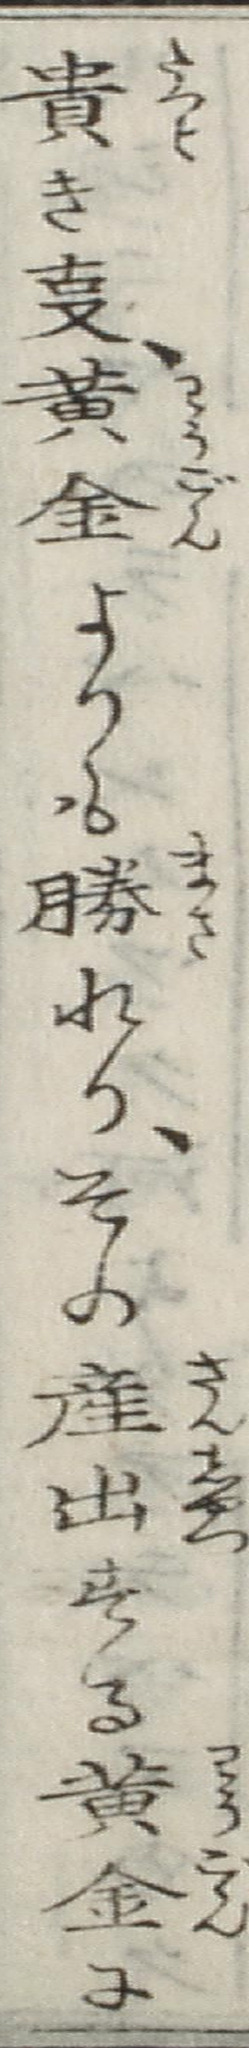貴き事、黄金よりも勝れり、その産出する黄金に
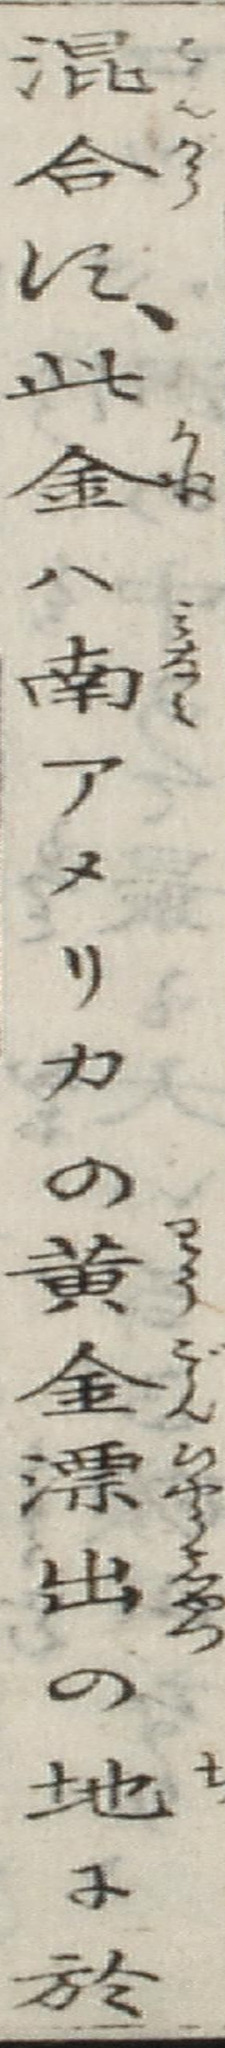混合す、此金は南アメリカの黄金漂出の地に於
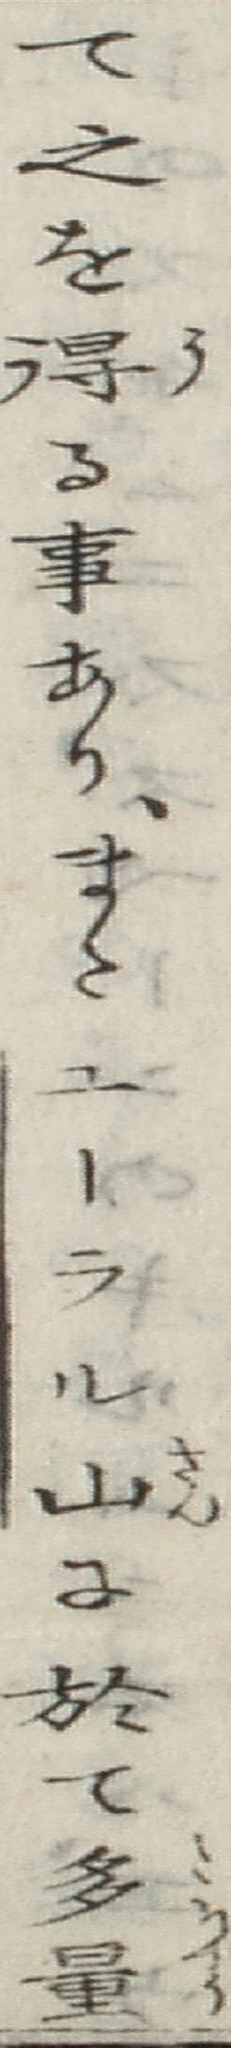て之を得る事あり、またユーラル山に於て多量
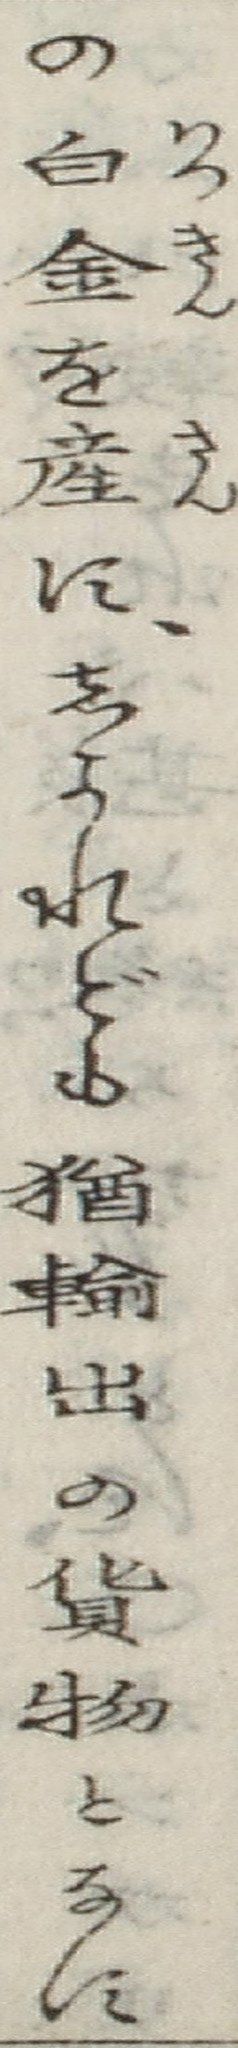の白金を産す、しかれども猶輸出の貨物となす
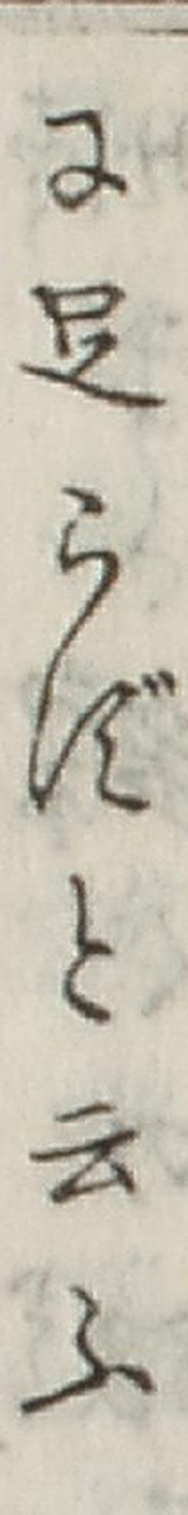に足らずと云ふ
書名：訓蒙　天然地理學　下
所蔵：東京大学地震研究所図書室 Earthquake Research Institute Library, The University of Tokyo, JAPAN
